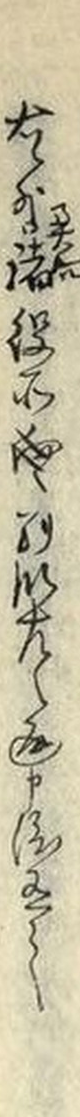右之外奥向諸役所へ別段左之通申渡有之
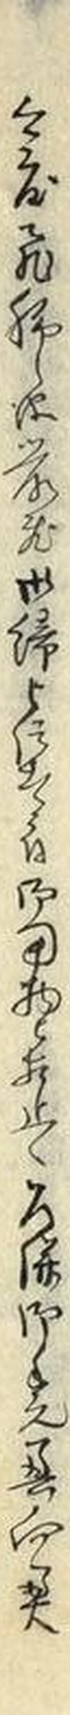今度飛脚之儀厳敷御締被仰出候ニ付御用物被相止候乍併御手元奥向奥
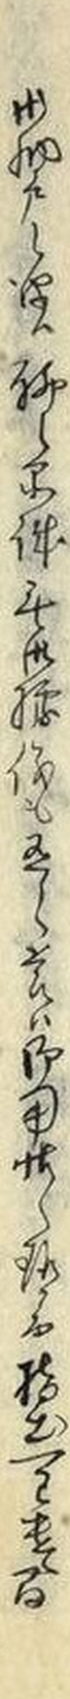御納戸之儀ハ聊之品体無御拠儀も有之節ハ御用状之趣ニ而指出可被遣候間
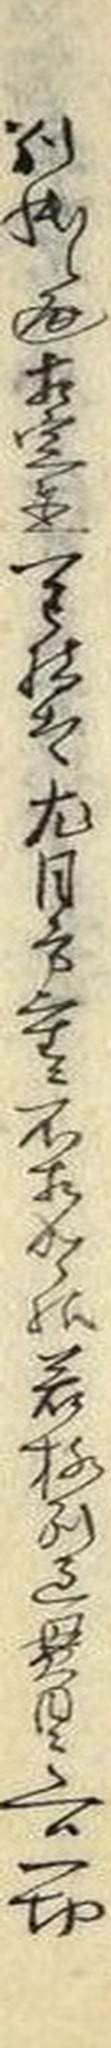別紙之通相定置可被指出候尤目方重ニ不相成候様若格別過貫目ニ候ヘハ一切

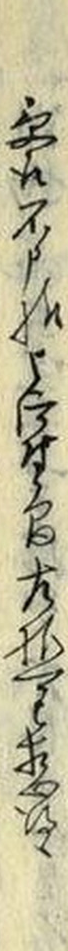受取不申様被仰付候間左様可被相心得候
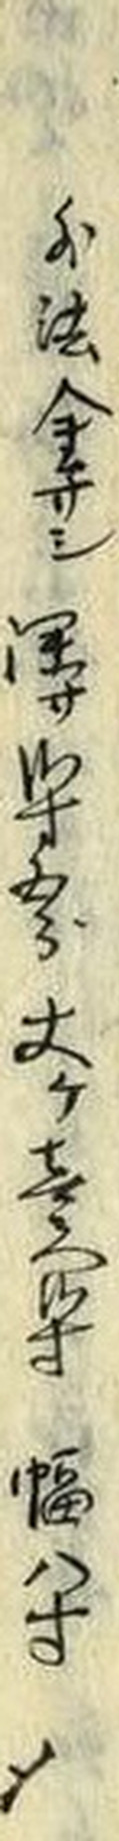外法金サシ深サ弐寸五分丈ケ壱尺弐寸幅八寸〆
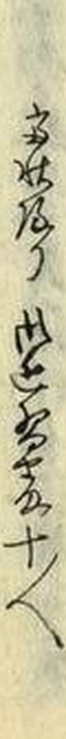当秋帰り御近習番十人
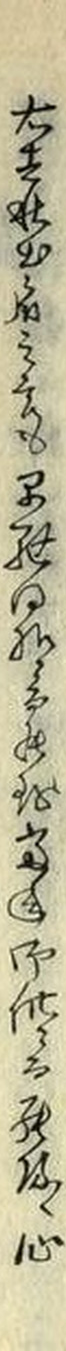右去秋出府之節も早駆同様ニ而罷越当年御供ニ而罷帰候心
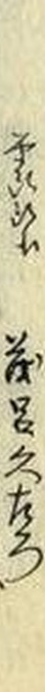筆頭頭取茂呂久左衛門
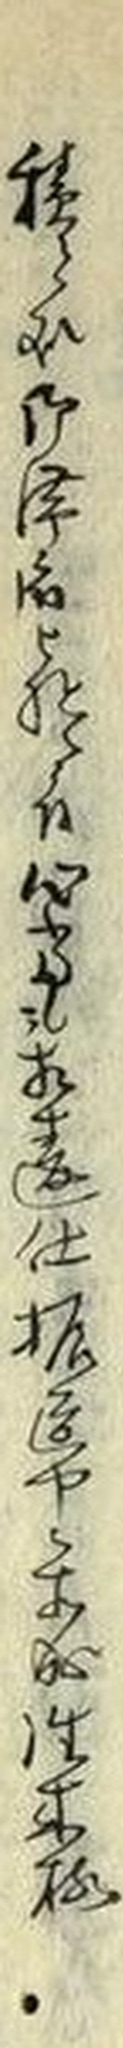積ニ候処御滞府被遊候ニ付心当も相違仕振道中ニ相成往来格
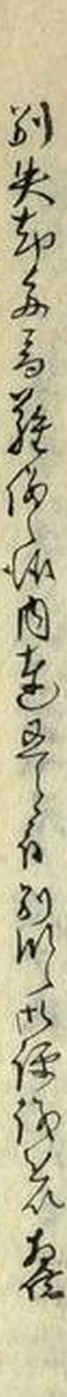別失脚多ニ而難儀之趣内達有之候ニ付別段之御評議を以拝借
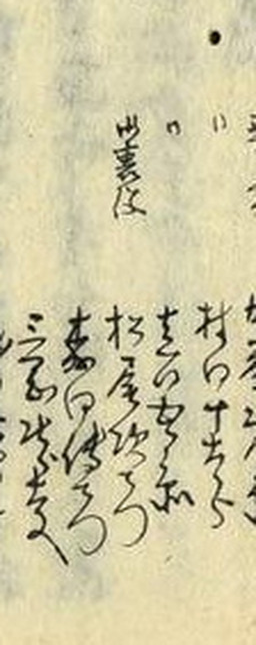御裏役松尾次右衛門
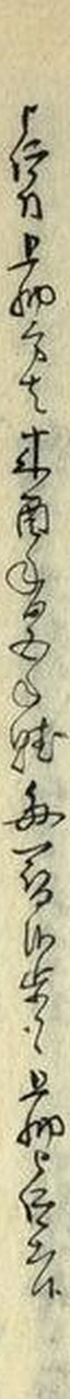被仰付上納方者来酉年ゟ五年賦毎暮弐歩ツヽ上納被仰出候
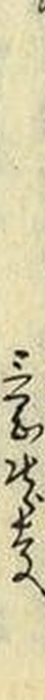三岡次郎太夫
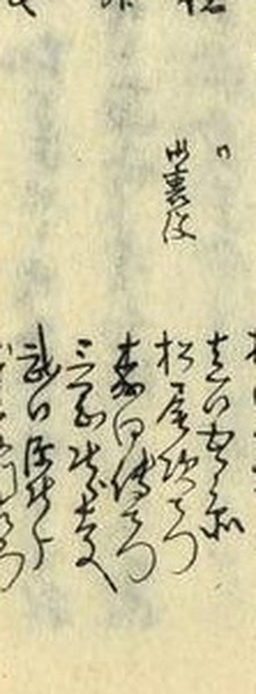森田伝右衛門
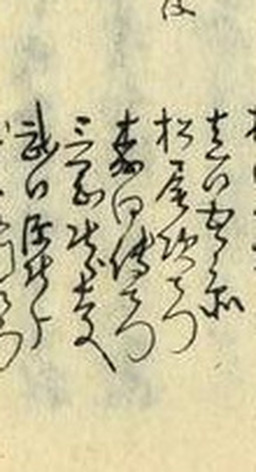森田伝右衛門
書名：少傅日録抄（斉善付側向頭取日記、在府）
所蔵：福井県文書館 Fukui Prefectural Archives
